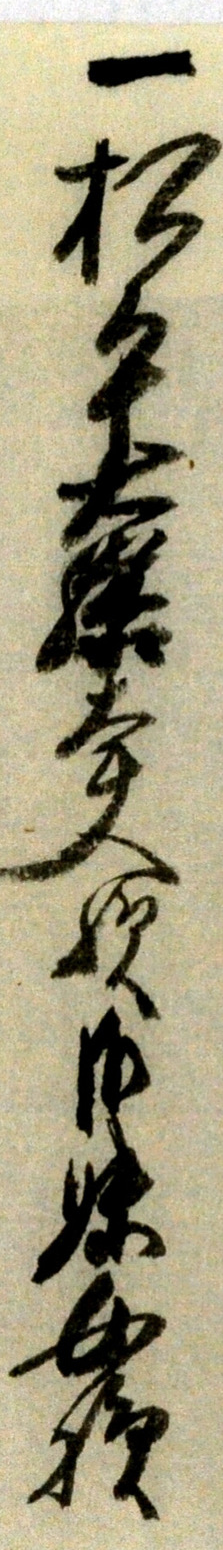一松平大膳大夫様御妹女様
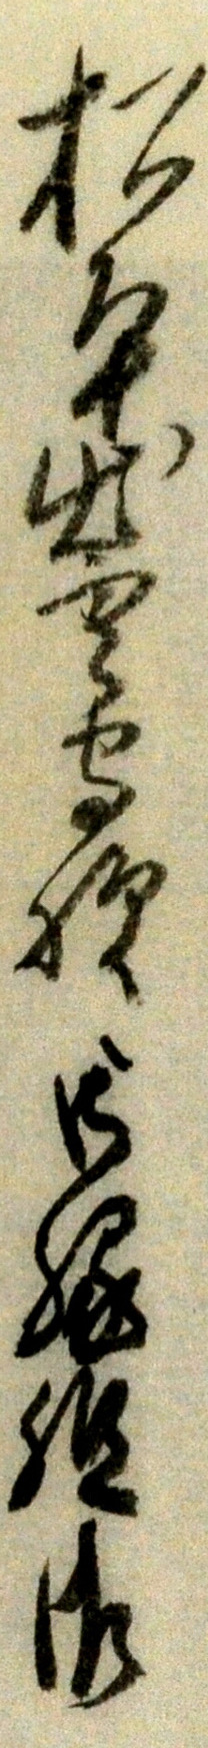松平出雲守様へ御縁組御
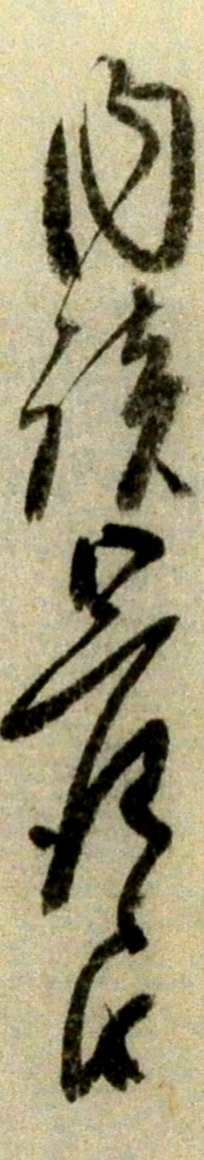内談御座候由
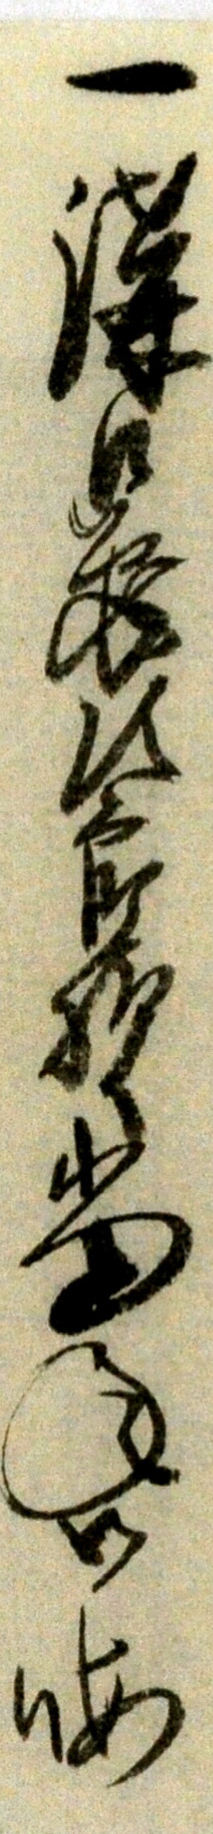一溝口亀次郎様当年御暇
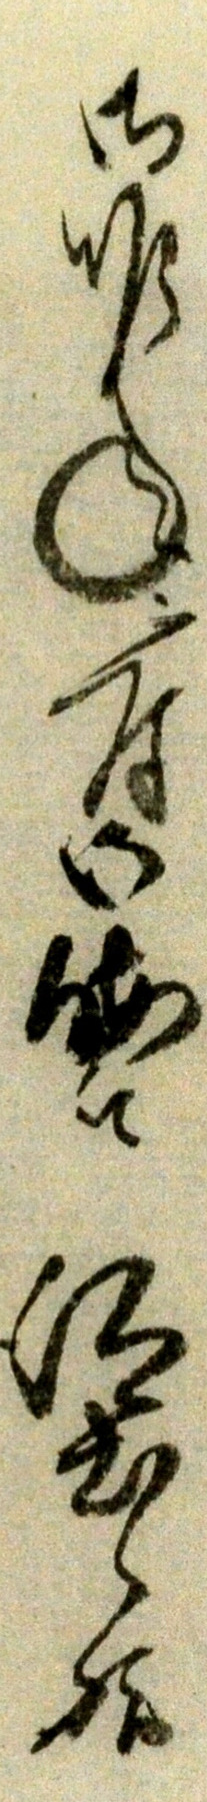御昨年に付御暇被仰出候様
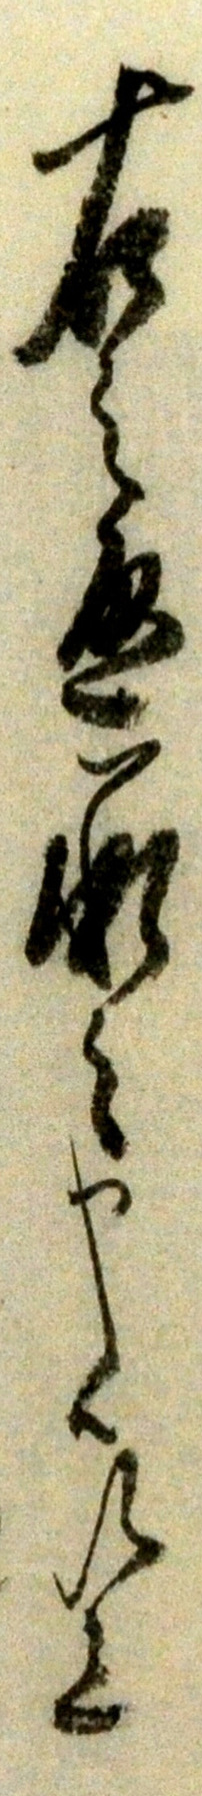右之通承之申候以上
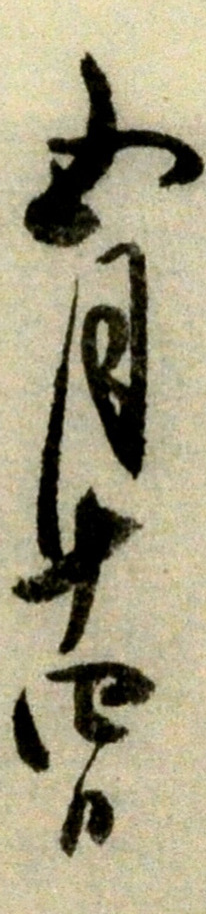五月十四日
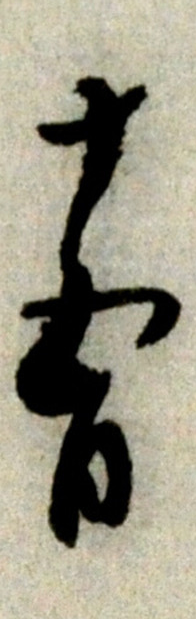十五日

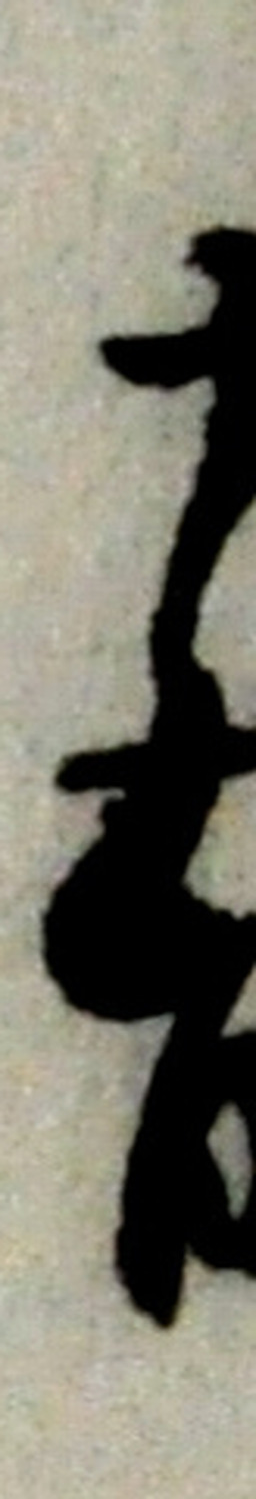十六日
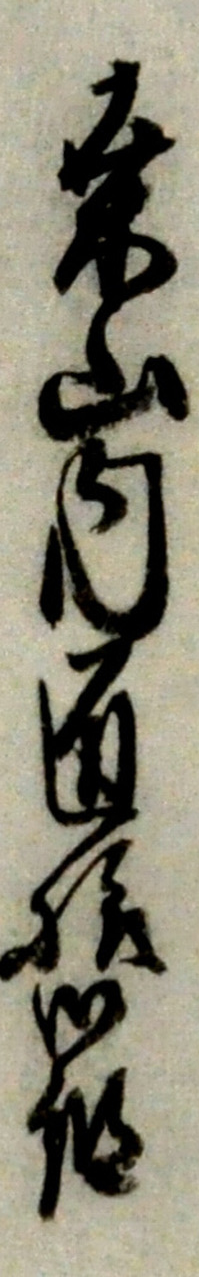桑山内匠様御組
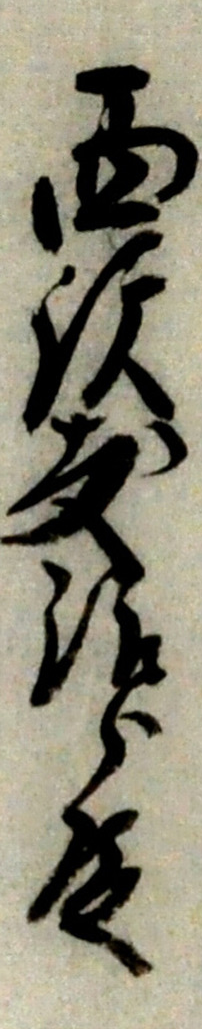西沢友治郎殿
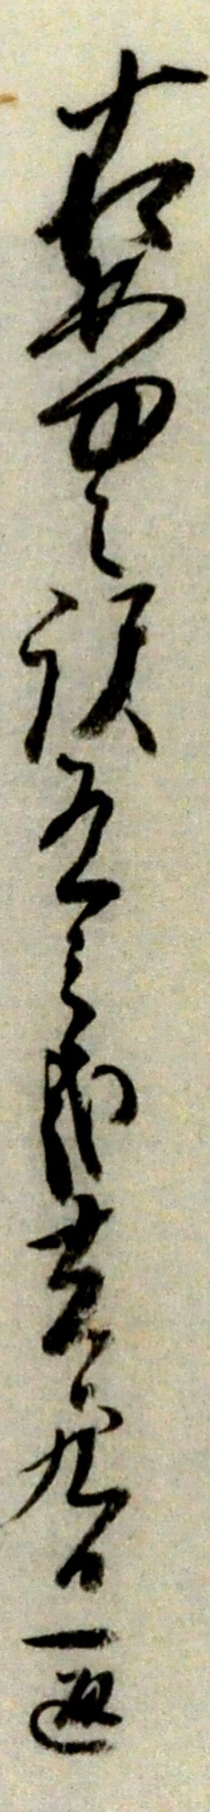右如何之訳有之哉去ル九日一通
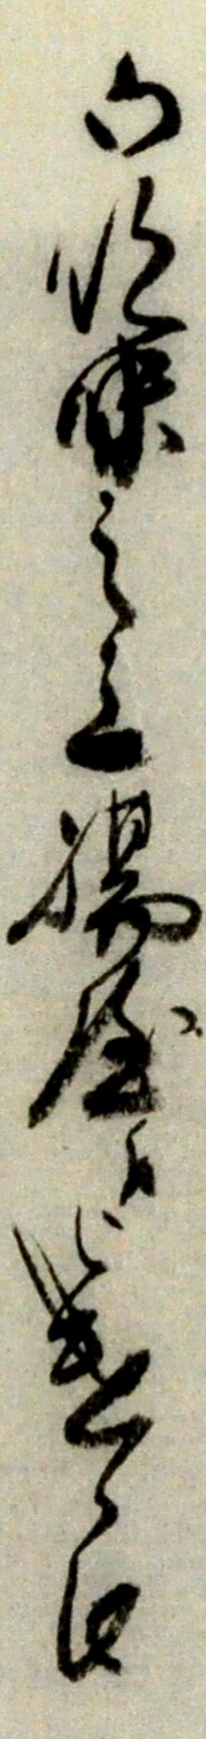御吟味之上揚屋え被遣候由
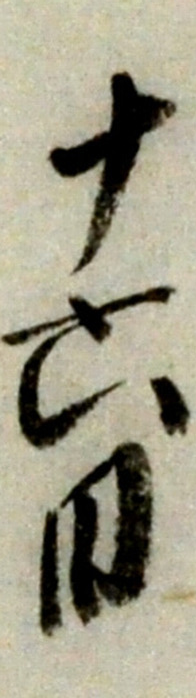十六日
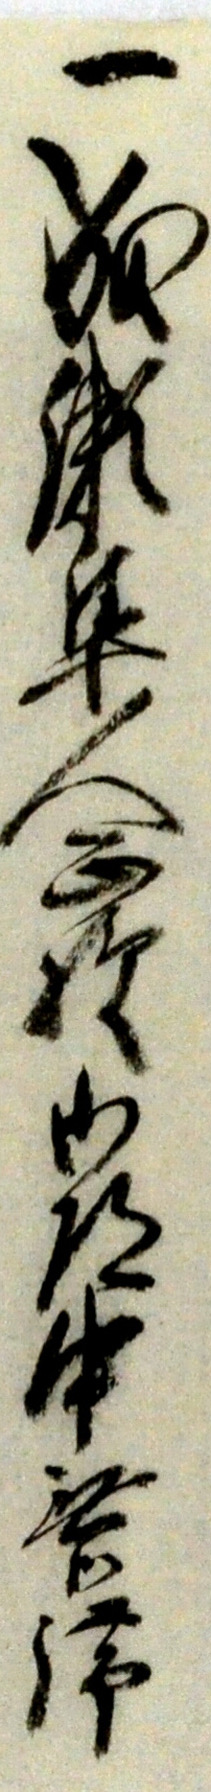一成瀬隼人正様御道中無御滞
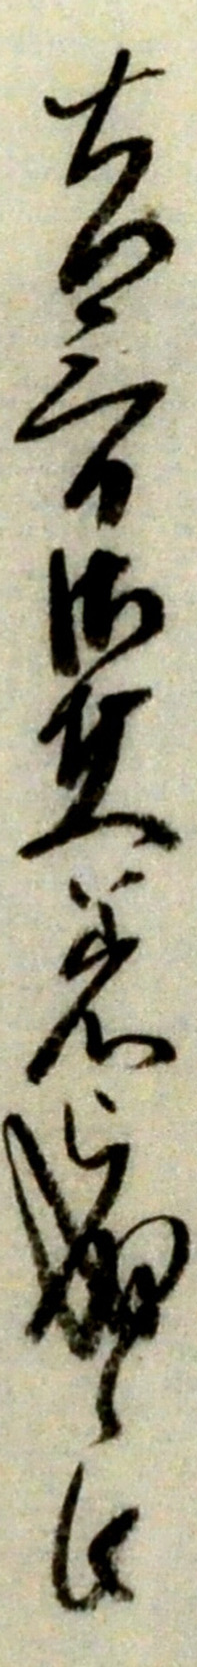去三日御在着被成候由
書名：申合帳〔一括〕
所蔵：伊那市立高遠町図書館・合同会社AMANE
